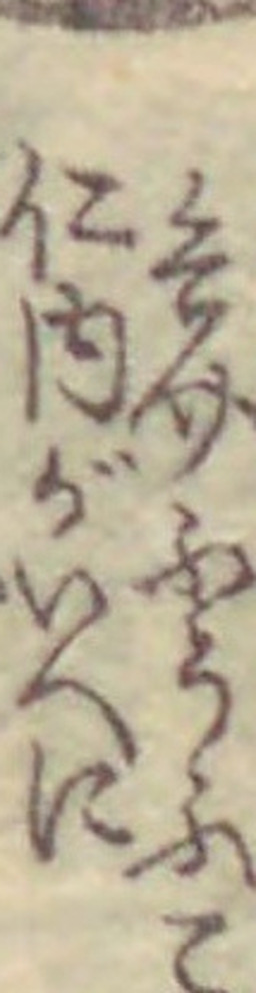仁内がいへに
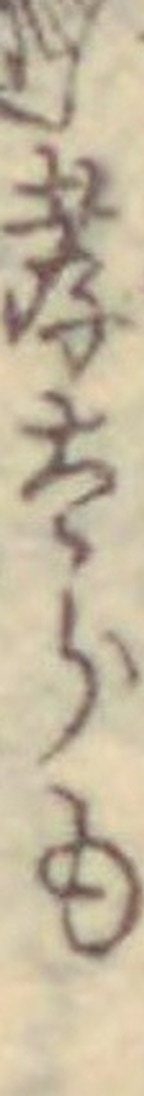孝太郎も
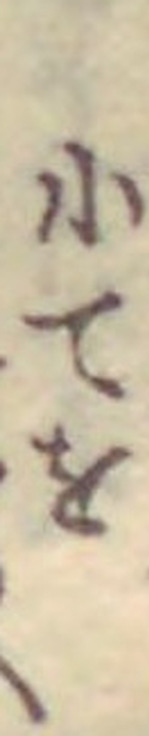小てを
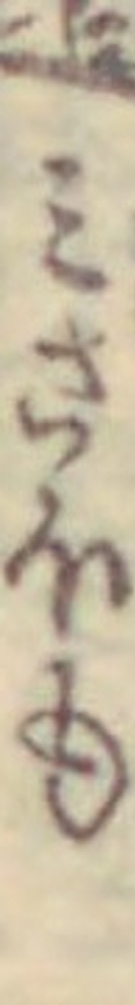みさほも
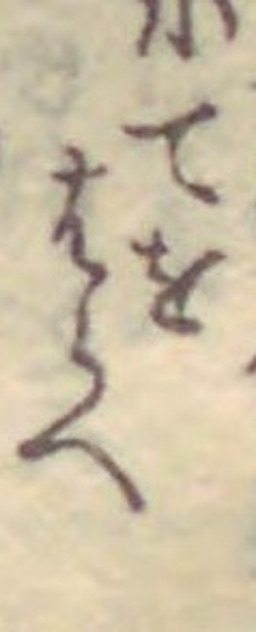はらへ
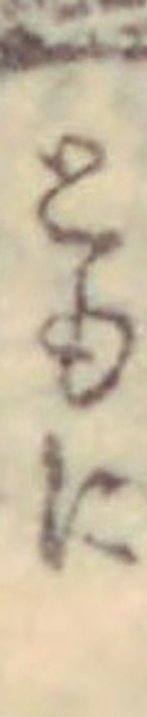ともに
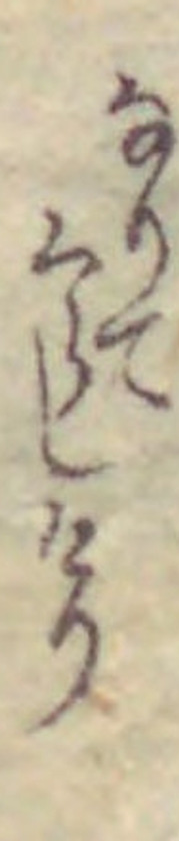くらしけり
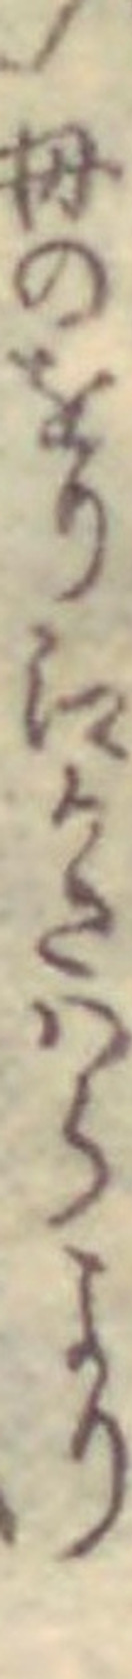母のをり江かたはらより
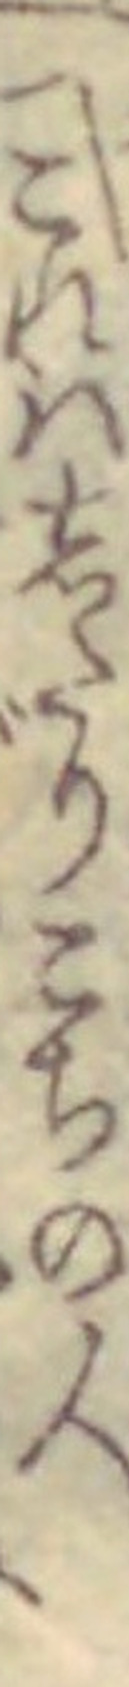〽これはしたりこちの人
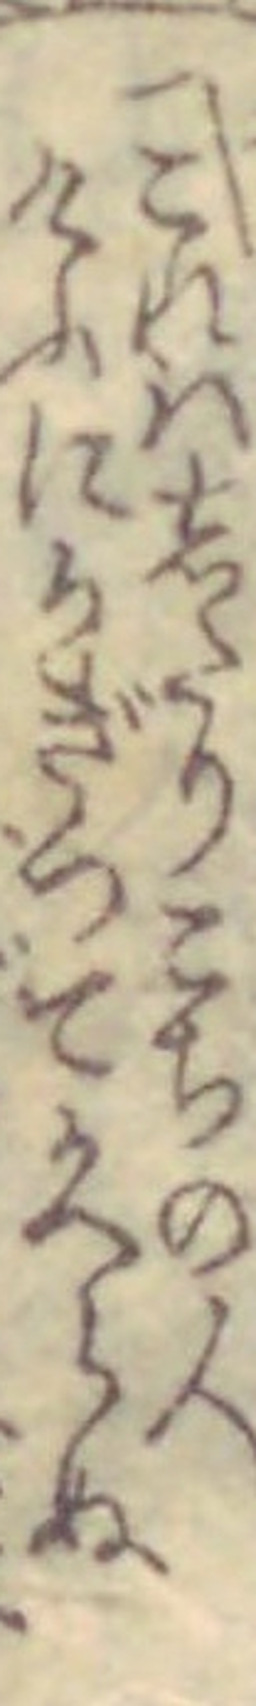けふにかぎつてかへらぬ
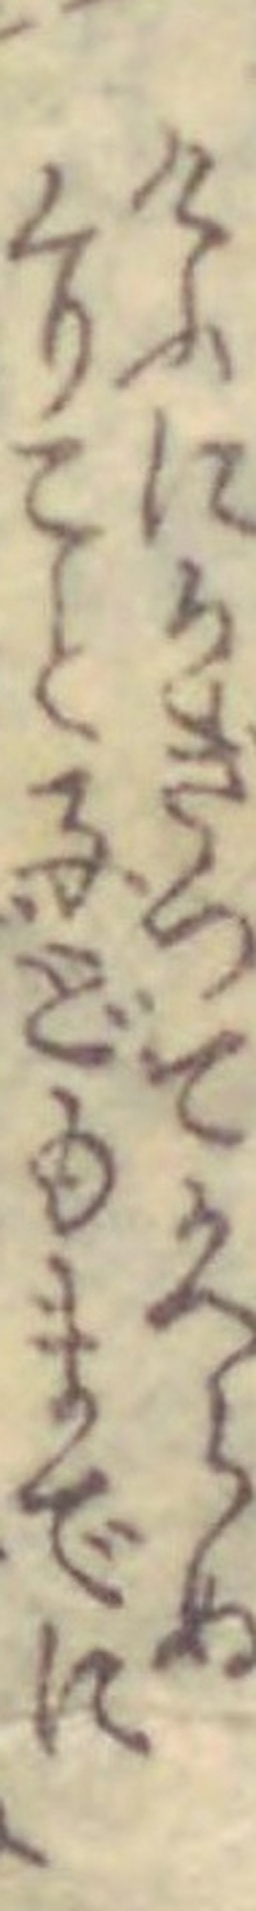くりこと子どもまでに
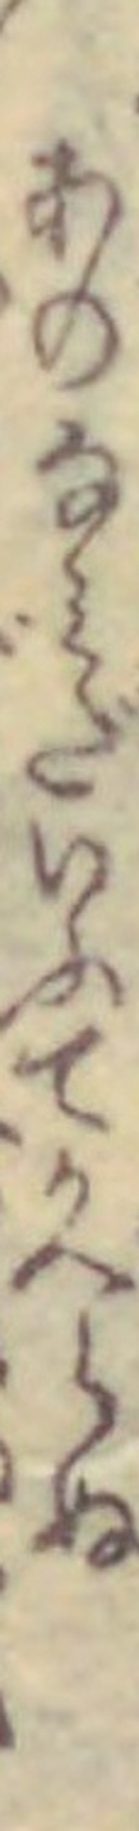あのなみだいふてかへらぬ
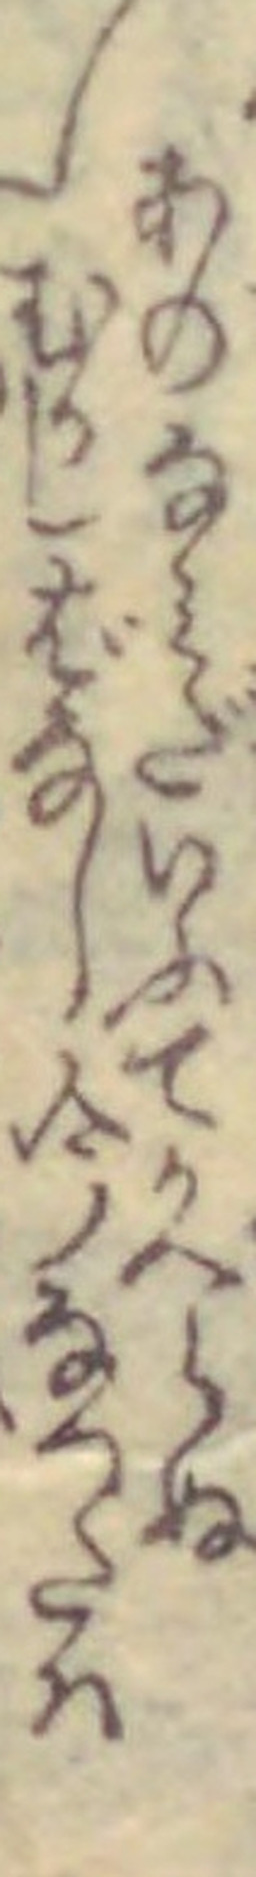むかしばなし今なつたは
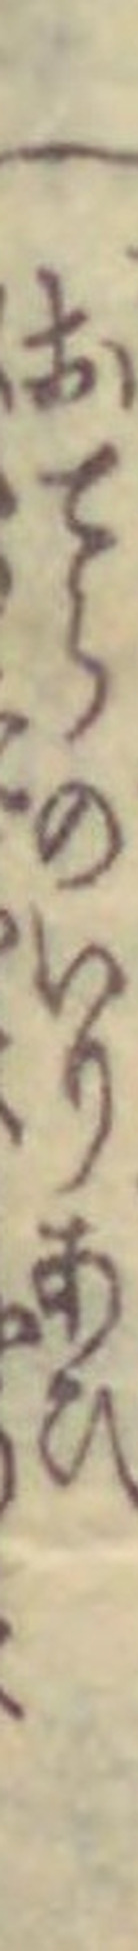おてらのいりあひ
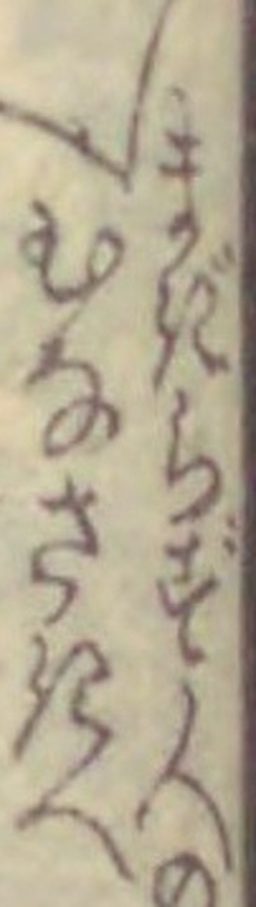むなさきへ
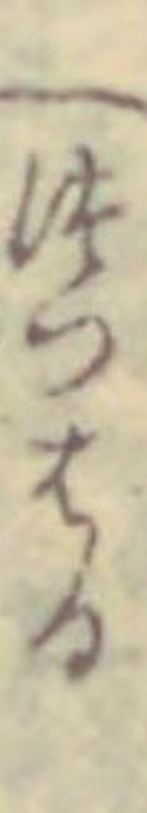つつはる
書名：八ツ目鱣因縁物語 3巻
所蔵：国立国会図書館 National Diet Library, JAPAN
